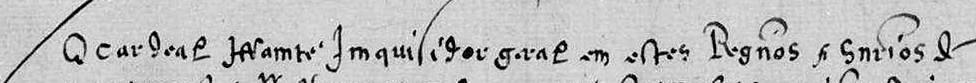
O cardeal Jffamte Jmquisidor geral em estes Regnos e Snrīos de
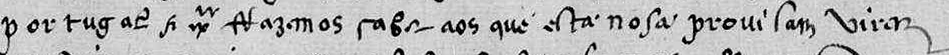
portugal e c̄ꝭ ffazemos saber aos que esta nosa prouisam virem
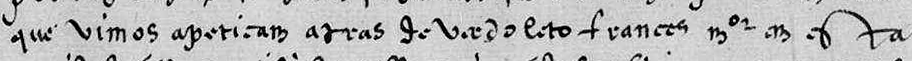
que vimos a petiçam atras de verdoleto frances mor em esta
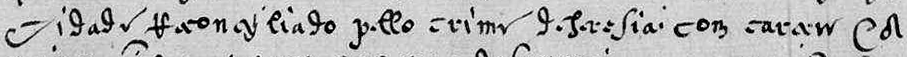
Cidade Reconcyliado pello crime de heresia com carcere e A
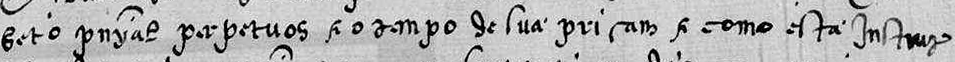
beto pnȳal perpetuos e o tempo de sua prisam e como esta Jnstruto
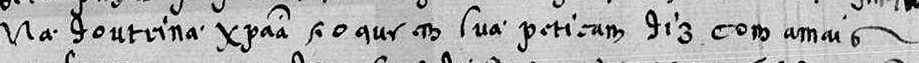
na doutrina xpāa e o que em sua petiçam diz com a mais
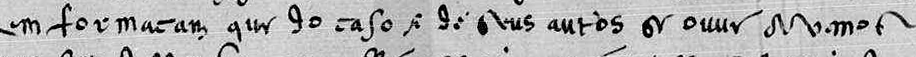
emformaçam que do caso e de seus autos se ouue Avemos
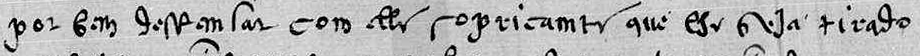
por bem despemsar com elle sopricamte que lhe seJa tirado
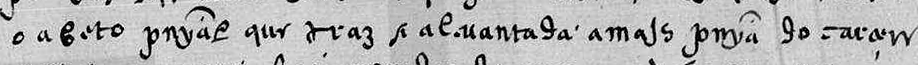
o abeto pnȳal que traz e aleuantada a maJs pnȳa do carcere
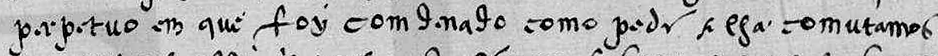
perpetuo em que foy comdenado como pede e lha comutamos
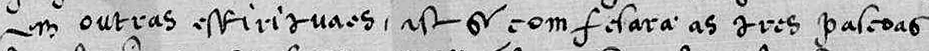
em outras espirituaes, este se comfesara as tres pascoas
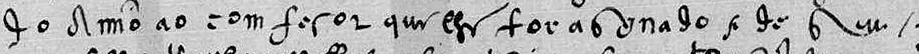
do Anno ao comfesor que lhe for asynado e de seu /.
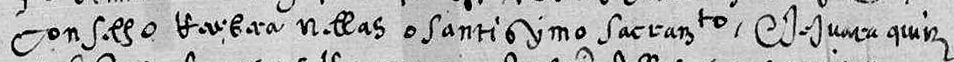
conselho Recebera nellas o santisymo sacramto / E JeJuara quin
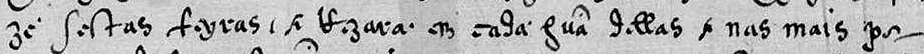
ze sestas feyras e Rezara em cada huā dellas e nas mais por
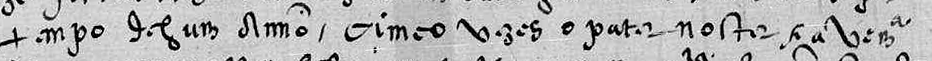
tempo de hum Annō cimco vezes o pater noster e ave ma
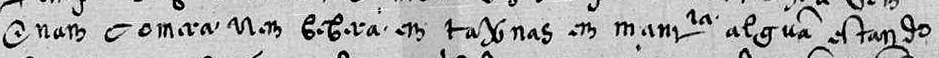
e nam comera nem bebera em taꝟnas em manrra alguā estando
